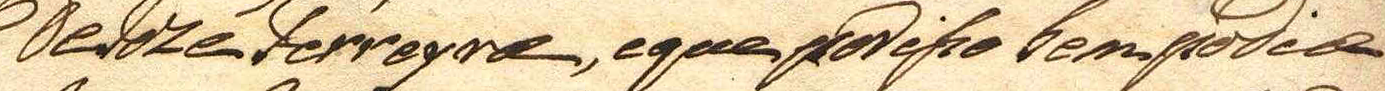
De Iozé Ferreyra, e que por isso bem podia
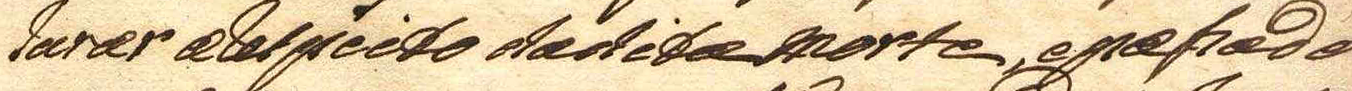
Iurar a Respeito da dita morte, e passado
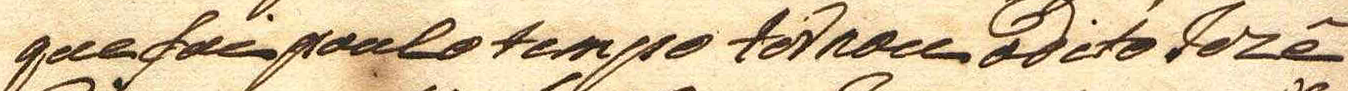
que foi pouCo tempo tornou o dito Iozê
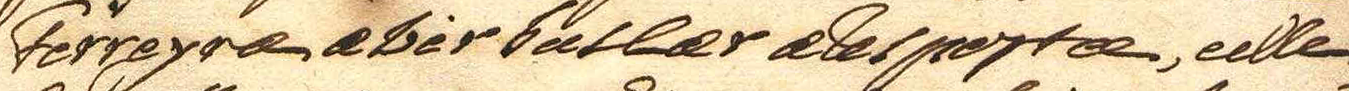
Ferreyra a vir busCar a Resposta, e elle
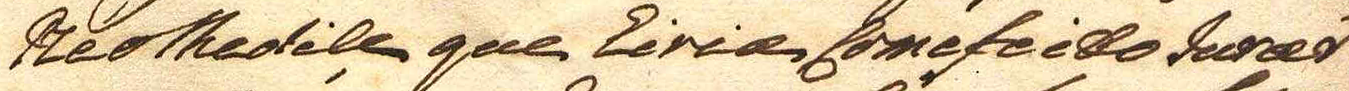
Réo lhe diÇe que hiria Com efeito Iurar
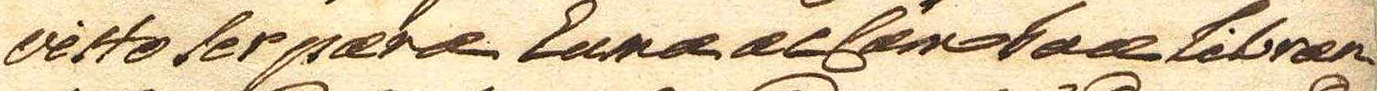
visto ser para huma acCam boa Livran
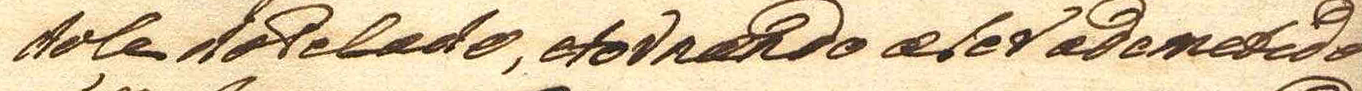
doÇe do PeCado, e tornando a ser ademetido
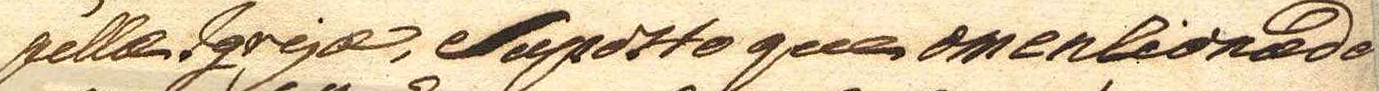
pella Igreja, Suposto que o menÇionado
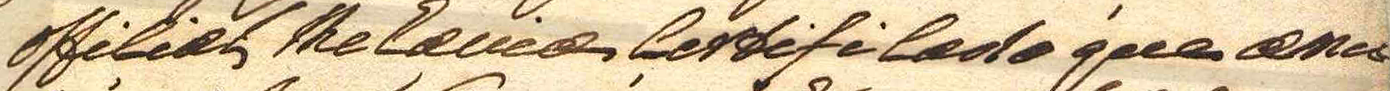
offiÇial lhe havia ÇertifiCado que a mu
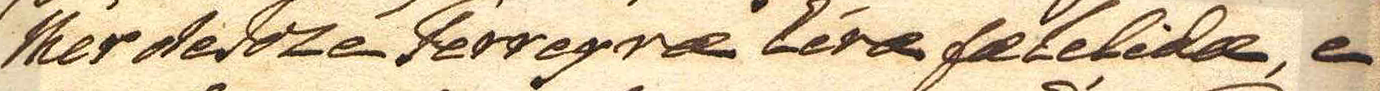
lher de Iozé Ferreyra héra faleÇida, e
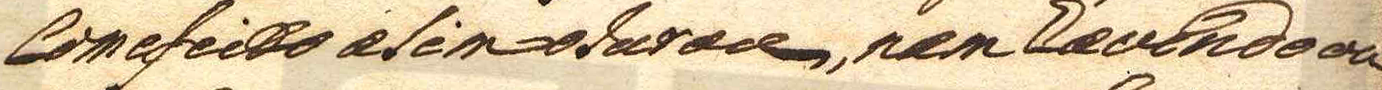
Com efeito asim o Iurou, nam havendo ou
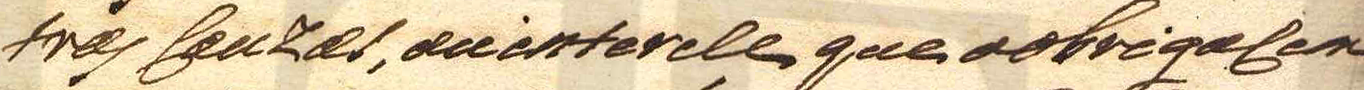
tras Couzas, ou intereÇe que o obrigaCem
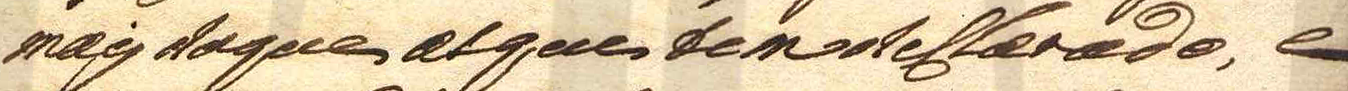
mais do que as que tem deClarado, e
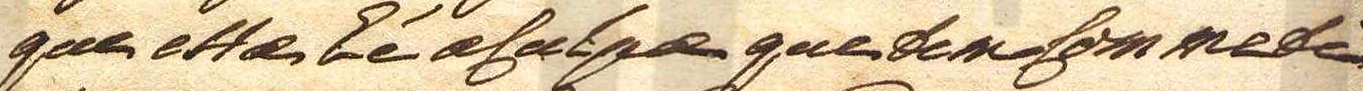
que esta hé a Culpa que tem Commeti
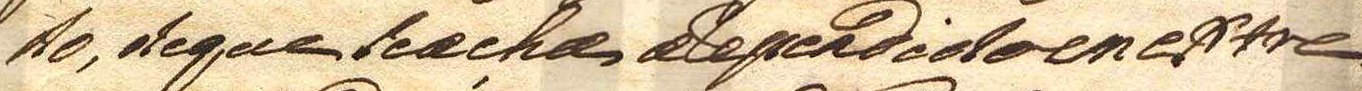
do, de que se açha aRependido em extre
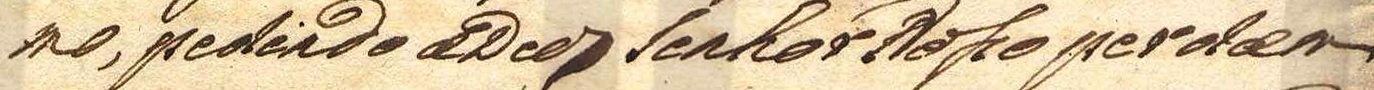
mo, pedindo a Deos senhor Nosso perdam
